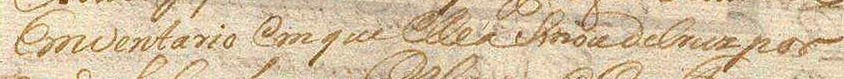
Emventario em que Elle asinou de Cruz por
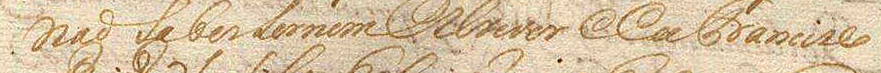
naõ saber Ler nem EsCrever E Eu Francisco
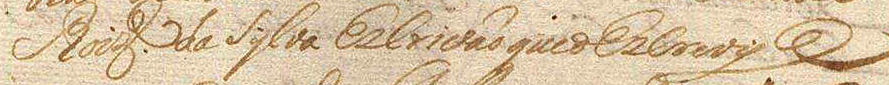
Roiz̄ da Sylva EsCrivaõ que o EsCrevy
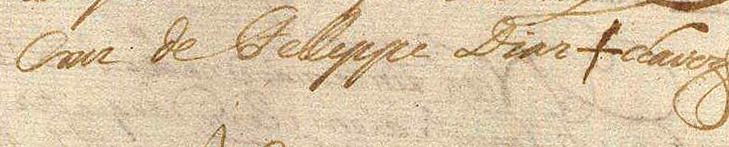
Cruz de Fellippe Diaz + chavez
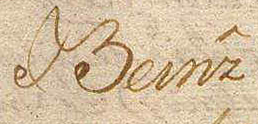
Beinz̄
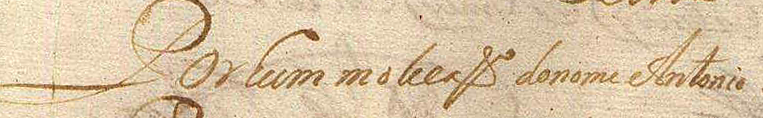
Por hum molecaõ do nome Antonio
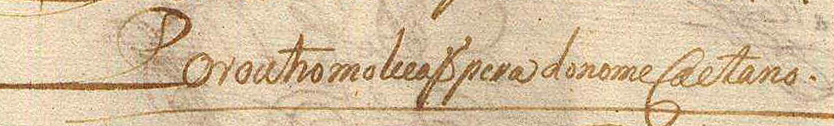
Por outro molecaõ pessa do nome Caetano.
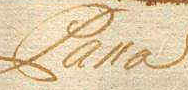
Passa
